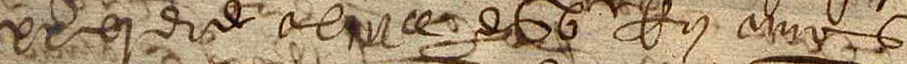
xxbj di de abryll de j̄ bc Rij annos
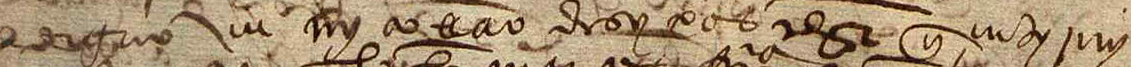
diguo eu nycollao de syxas c̄hr q̄ eu tyrey
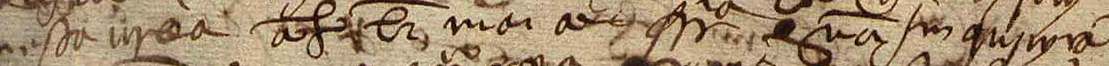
nesta ujlla c̄o ho b̄r marcos frrra hūa Jmqujryçā
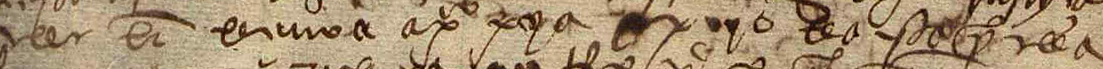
q̄ elle b̄r lleuou a propya e poys lla esta p̄o ella
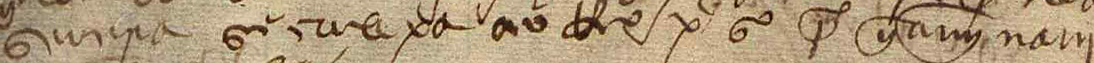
se uera sē cullpa ao Reo p̄so p̄o q̄ a m̄j nam
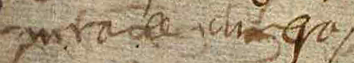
me allembra /
